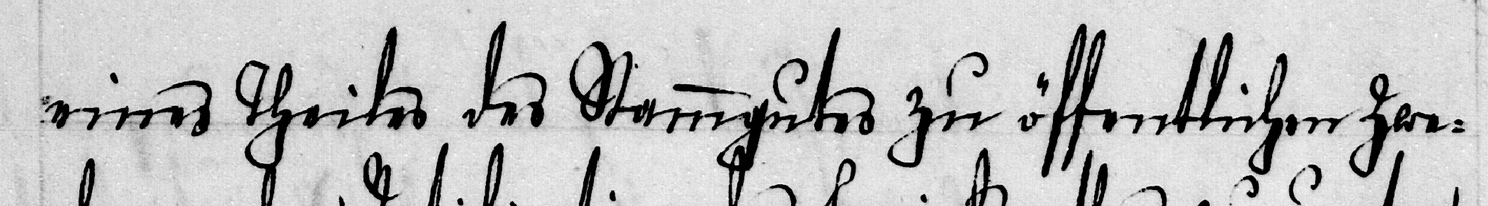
eines Theiles des Stammgutes zu öffentlichen Zwe¬
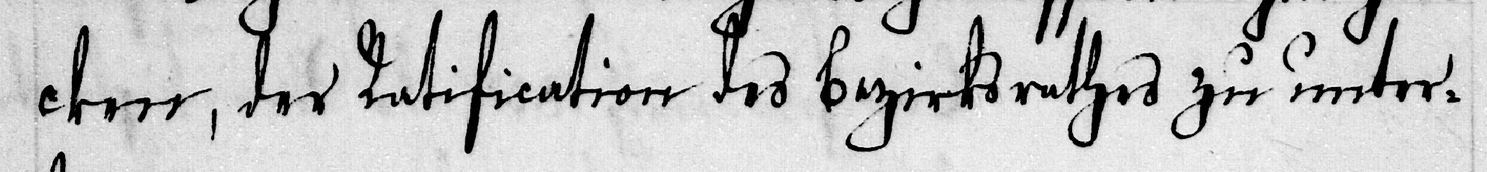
cken, der Ratification des Bezirksrathes zu unter¬
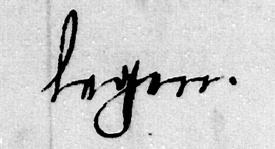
legen.
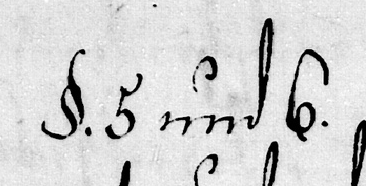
§. 5 und 6.
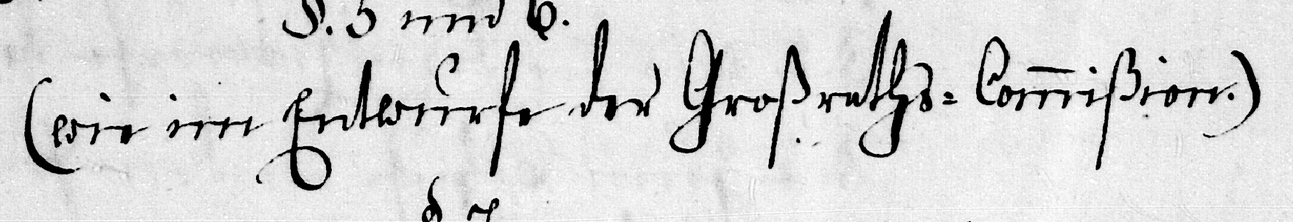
(wie im Entwurfe der Großraths-Commißion.)
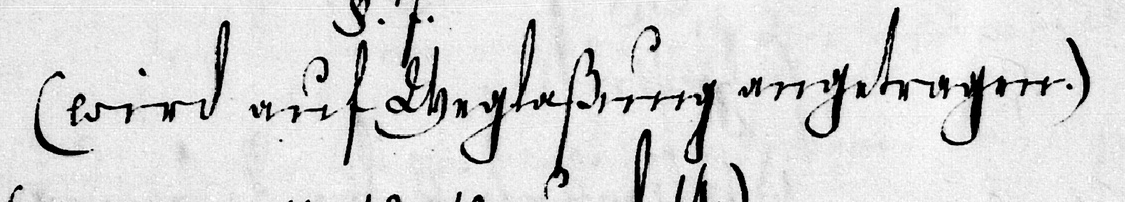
(wird auf Weglaßung angetragen.)
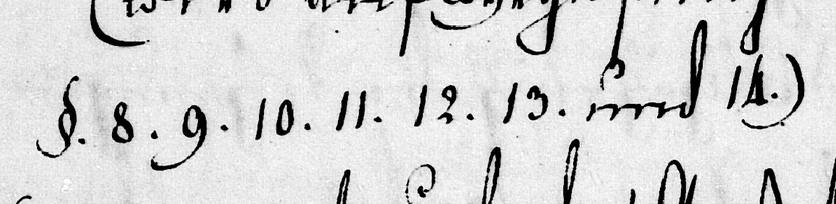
§. 8. 9. 10. 11. 12. 13. und 14.)
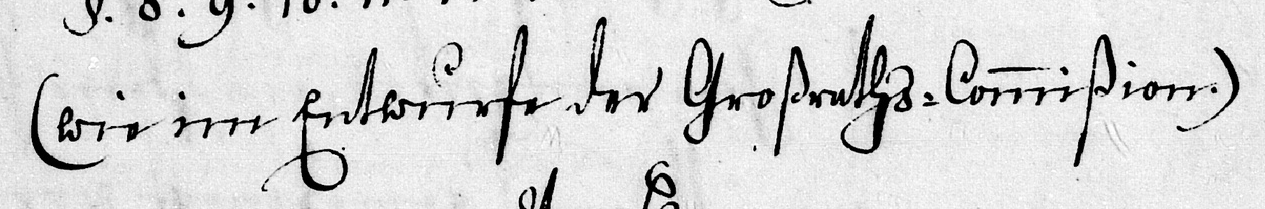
(wie im Entwurfe der Großraths-Commißion.)
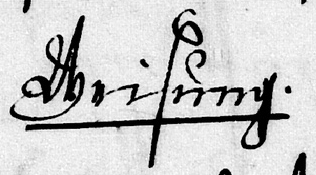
Weisung.
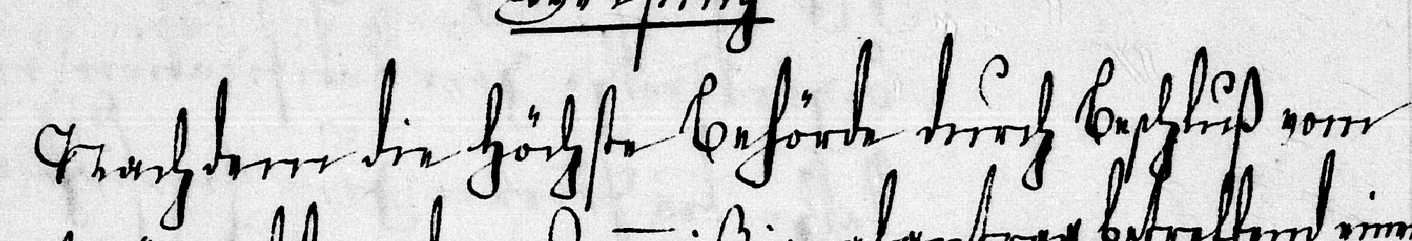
Nachdem die Höchste Behörde durch Beschluß vom
